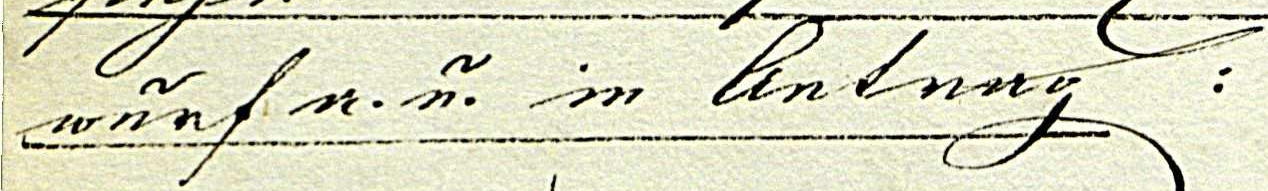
wurfe a.u. in Antrag:
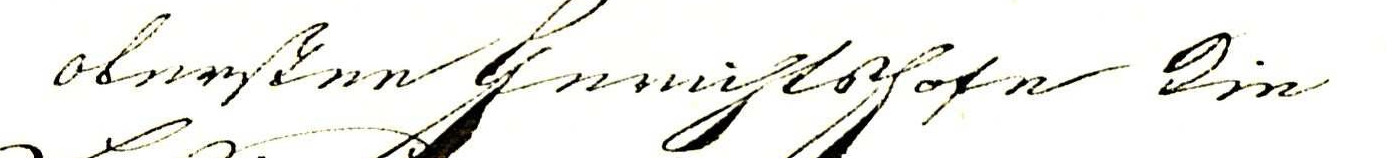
Obersten Gerichtshofe die
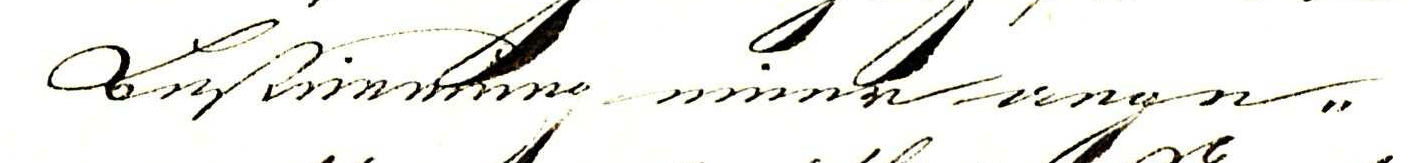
Bestimmung einer ange¬
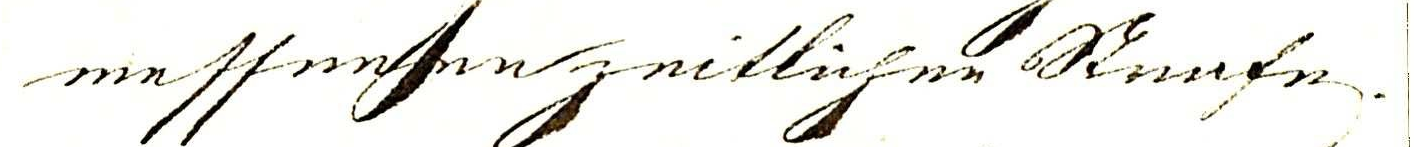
messenen zeitlichen Strafe.
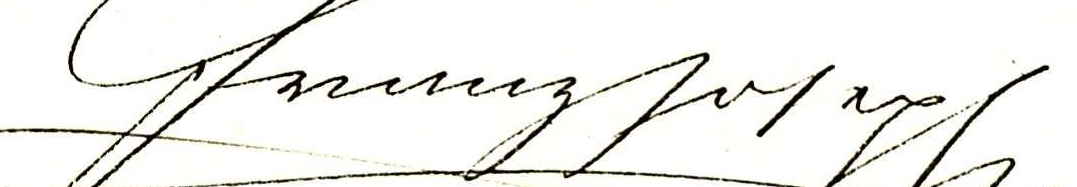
Franz Joseph
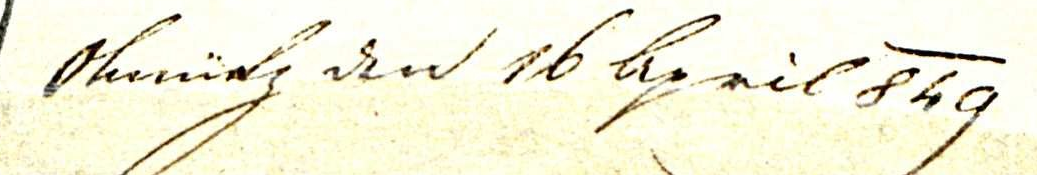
Olmütz den 16. April1849
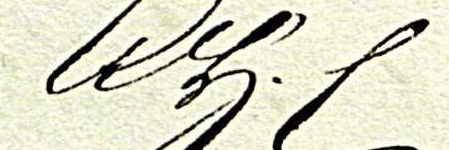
Ah. E.
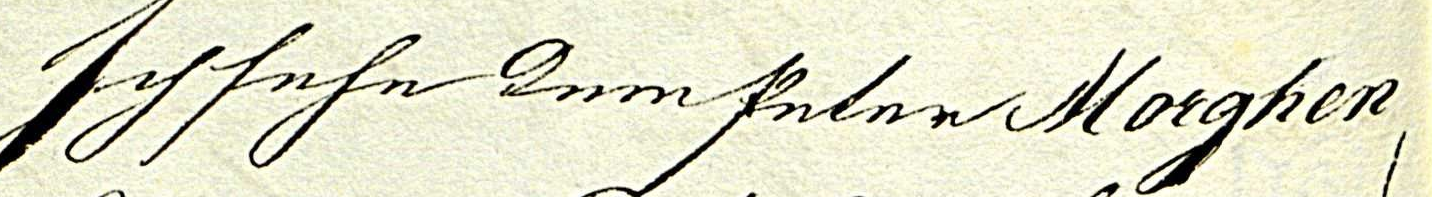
Ich sehe dem Peter Morghen
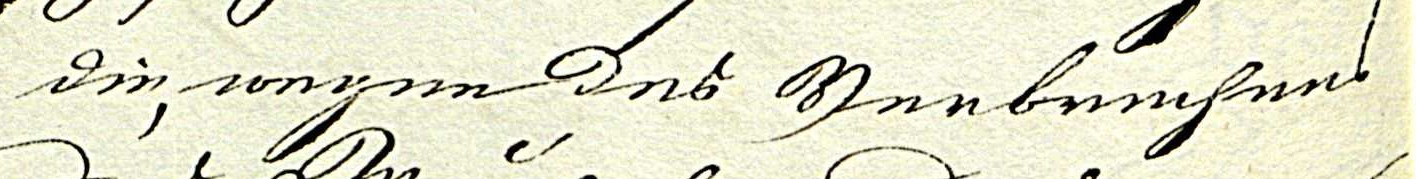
die, wegen des Verbrechens
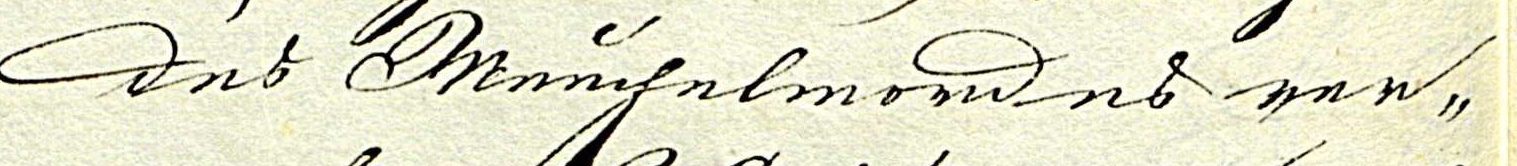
des Meuchelmordes ver¬
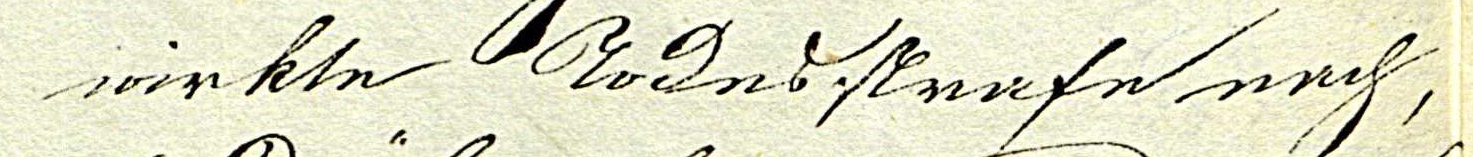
wirkte Todesstrafe nach
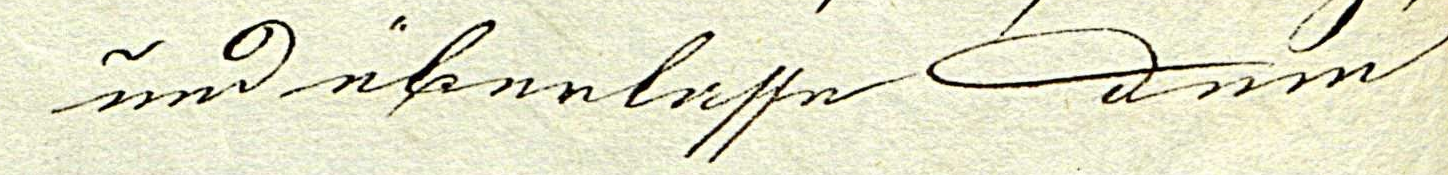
und überlasse dem
